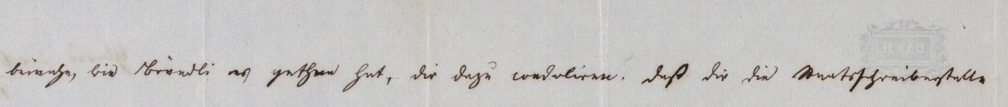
beinahe, wie Brändli es gethan hat, Dir dazu condoliren. Daß Dir die Staatsschreiberstelle
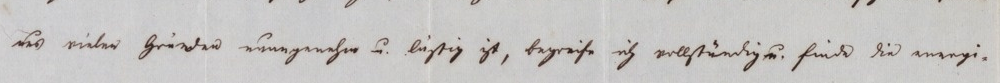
aus vielen Gründen unangenehm u. lästig ist, begreife ich vollständig u. finde die energi-
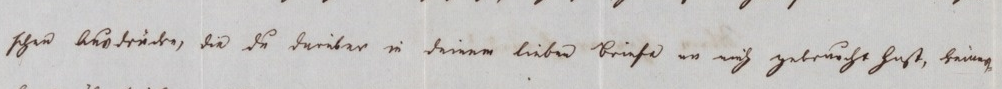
schen Ausdrücke, die Du darüber in Deinem lieben Briefe an mich gebraucht hast, keines-
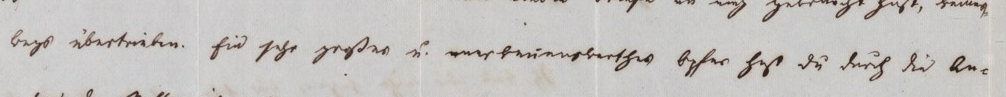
wegs übertrieben. Ein sehr großes u. anerkennenswerthes Opfer hast Du durch die An-
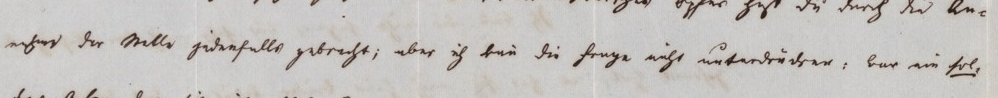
nahme der Stelle jedenfalls gebracht; aber ich kann die Frage nicht unterdrücken: war ein sol-
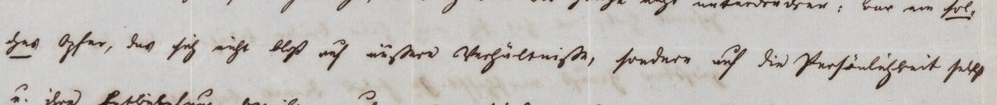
ches Opfer, das sich nicht bloß auf äußere Verhältnisse, sondern auf die Persönlichkeit selbst
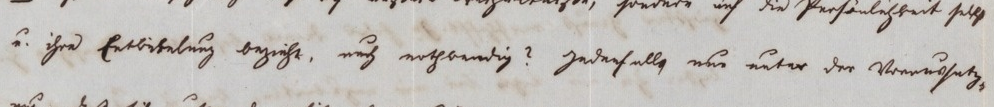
u. ihre Entwickelung bezieht, auch nothwendig? Jedenfalls nur unter der Voraussetz-
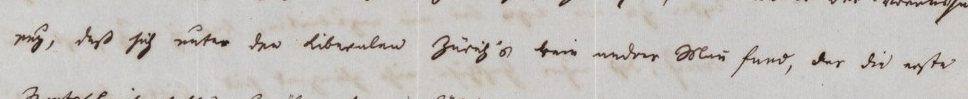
ung, daß sich unter den Liberalen Zürich's kein andrer Mann fand, der die erste
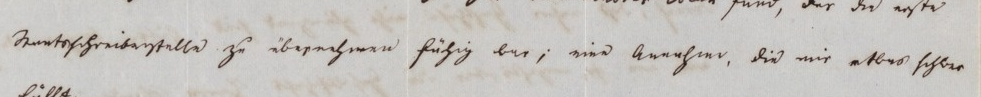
Staatsschreiberstelle zu übernehmen fähig war; eine Annahme, die mir etwas schwer
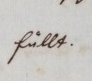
fällt.
